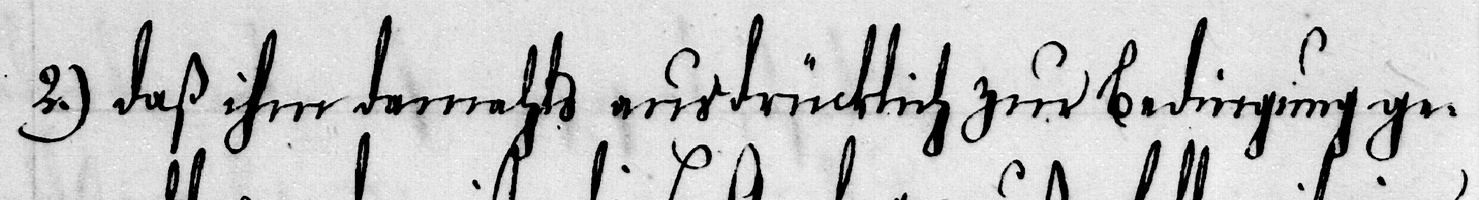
2.) daß ihm damahls ausdrücklich zur Bedingung ge¬
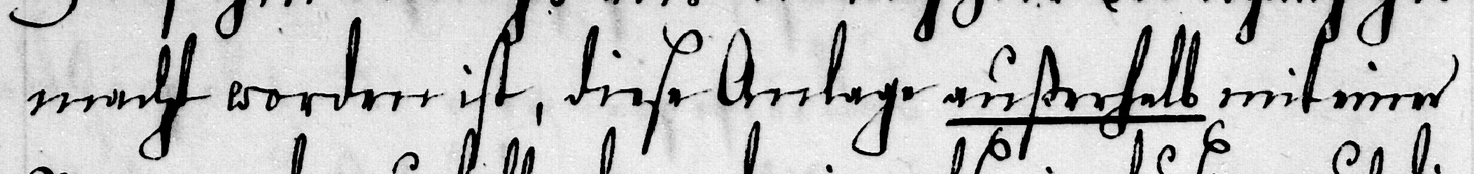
macht worden ist, diese Anlage außerhalb mit einer
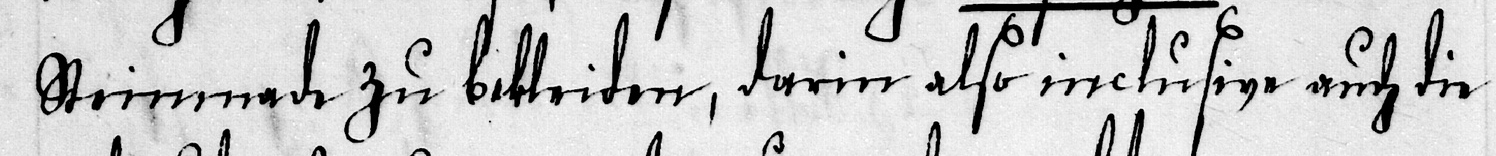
Steinmade zu bekleiden, darin also inclusive auch die
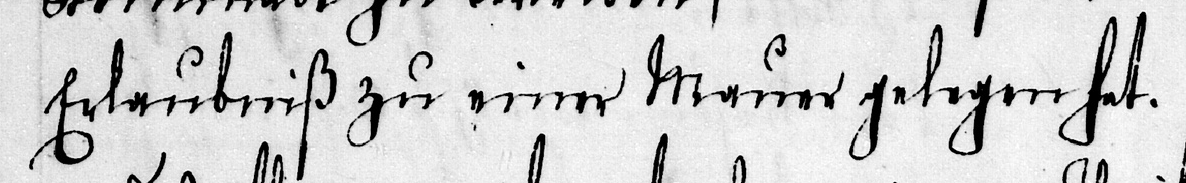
Erlaubniß zu einer Mauer gelegen hat.
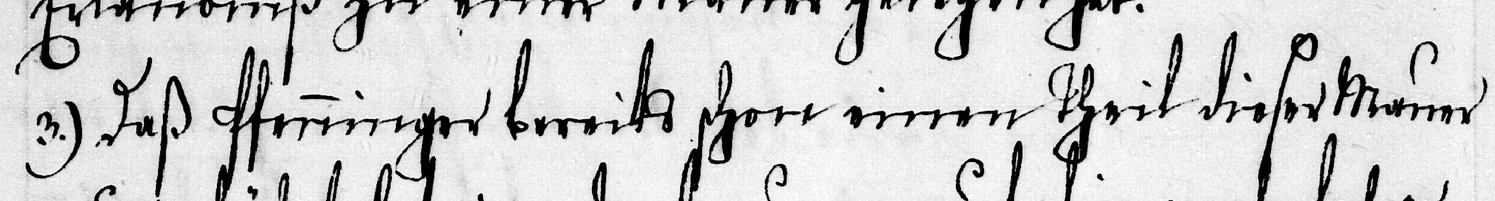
3.) Daß Pfenninger bereits schon einen Theil dieser Mauer
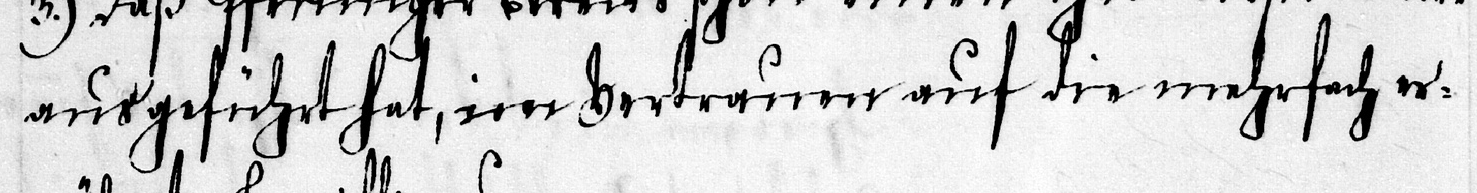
ausgeführt hat, im Vertrauen auf die mehrfach er¬
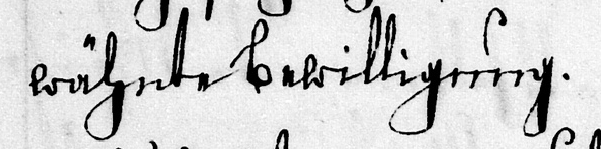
wähnte Bewilligung.
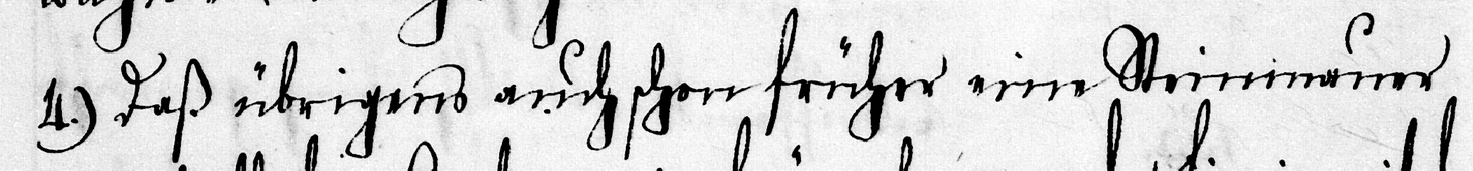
4.) Daß übrigens auch schon früher eine Steinmauer
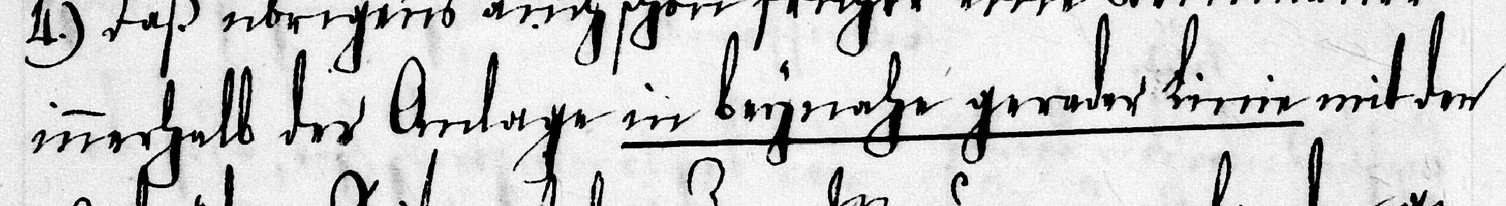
innerhalb der Anlage in beynahe gerader Linie mit den
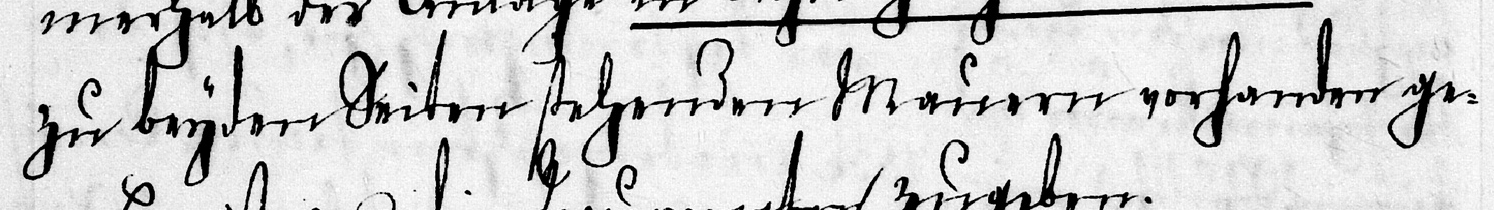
zu beyden Seiten stehenden Mauern vorhanden ge¬
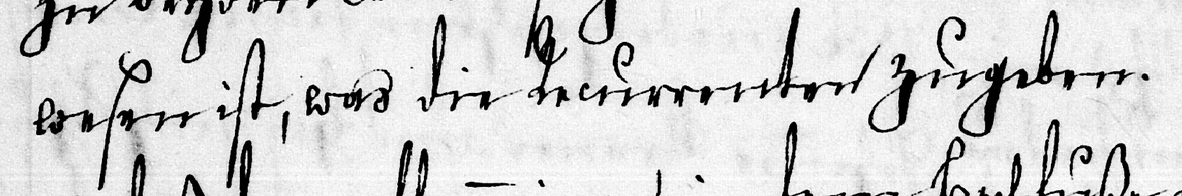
wesen ist, was die Recurrenten zugeben.
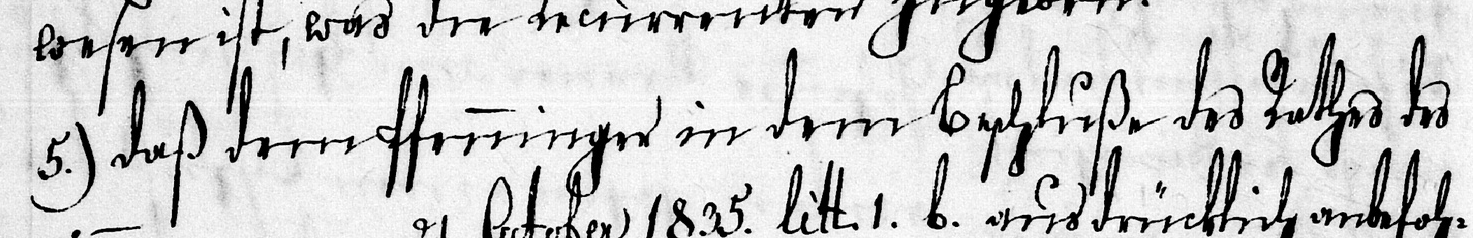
5.) daß dem Pfenninger in dem Beschluße des Rathes des
